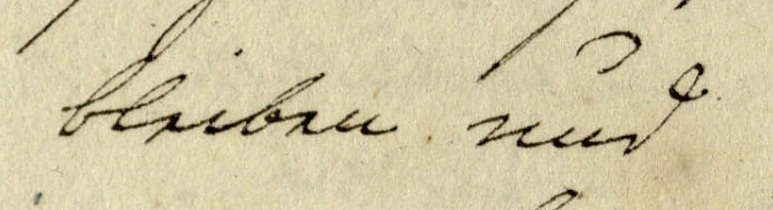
bleiben und
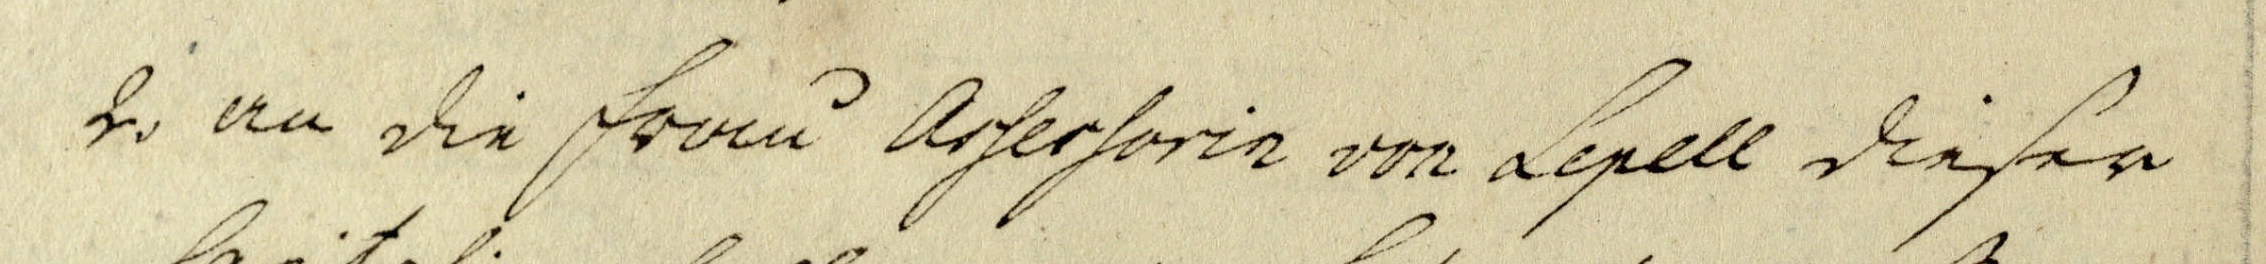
2. an die Frau Assessorin von Lepell dieser
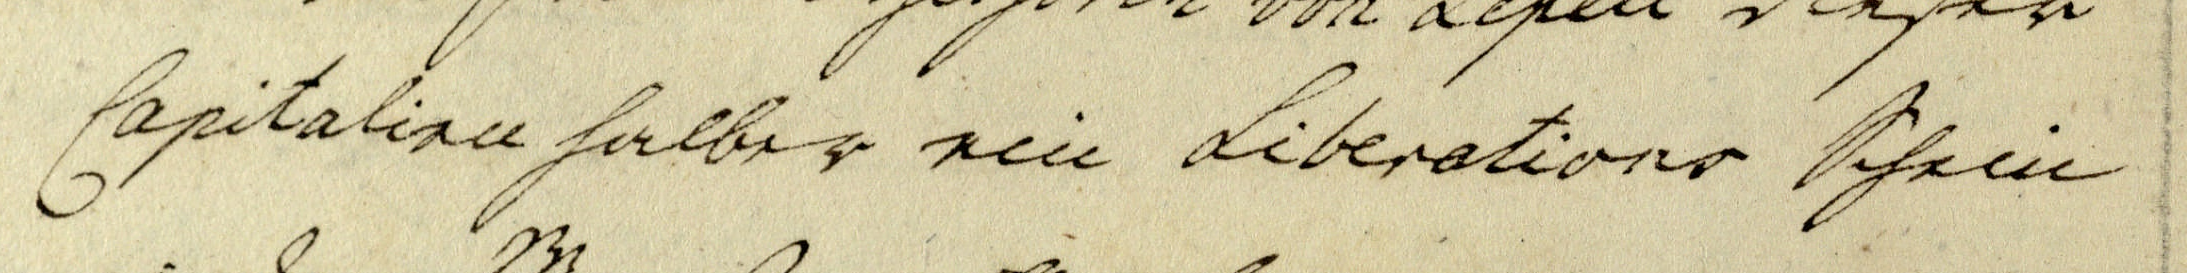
Capitalien halber ein Liberations Schein
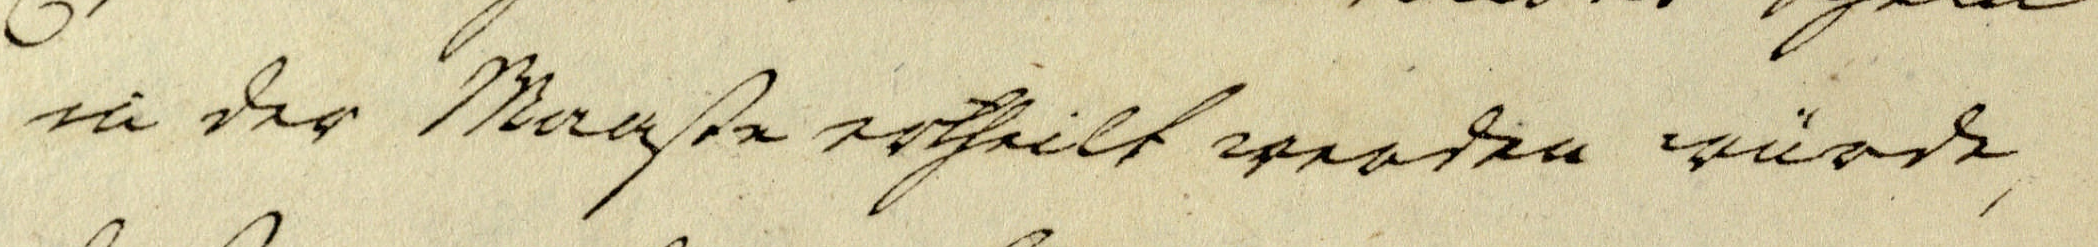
in der Maaße ertheilt werden würde,
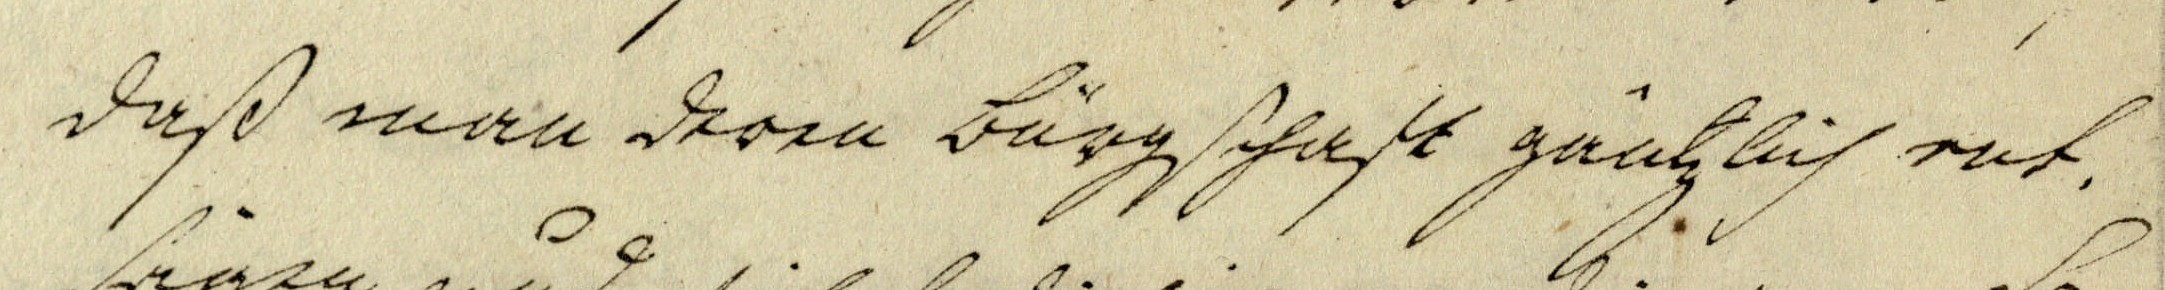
daß man deren Bürgschaft gäntzlich ent¬
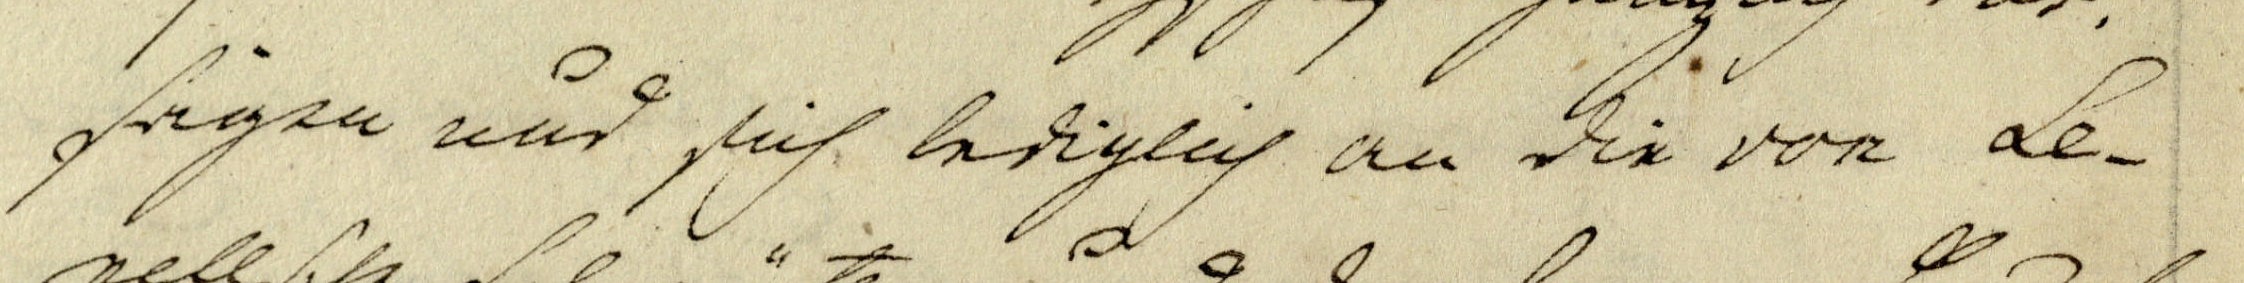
sagen und sich lediglich an die von Le¬
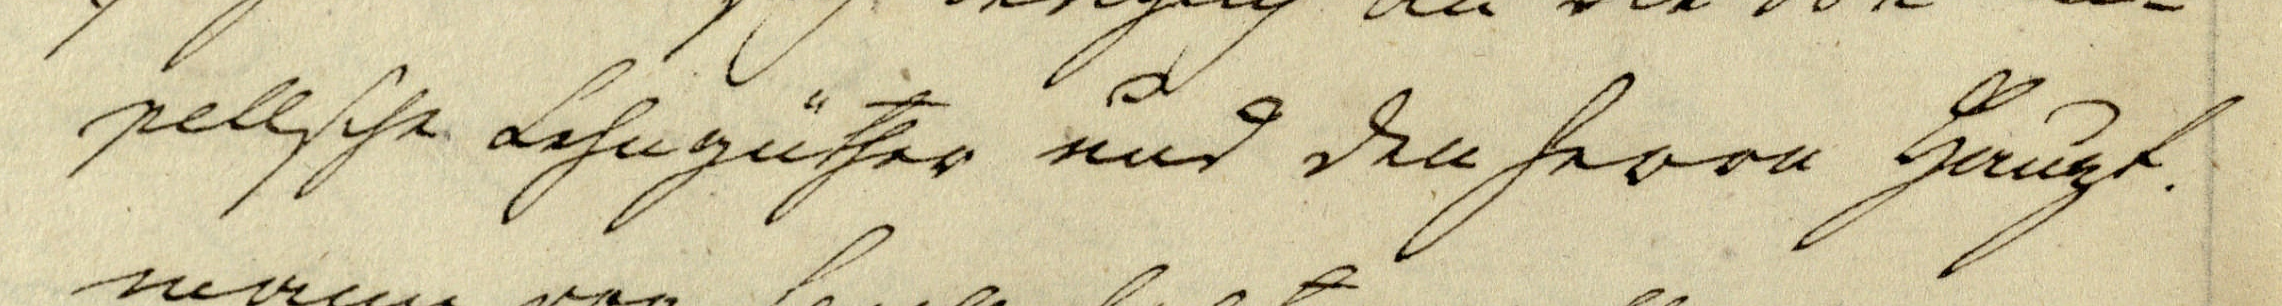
pellsche Lehngüther und den Herrn Haupt¬
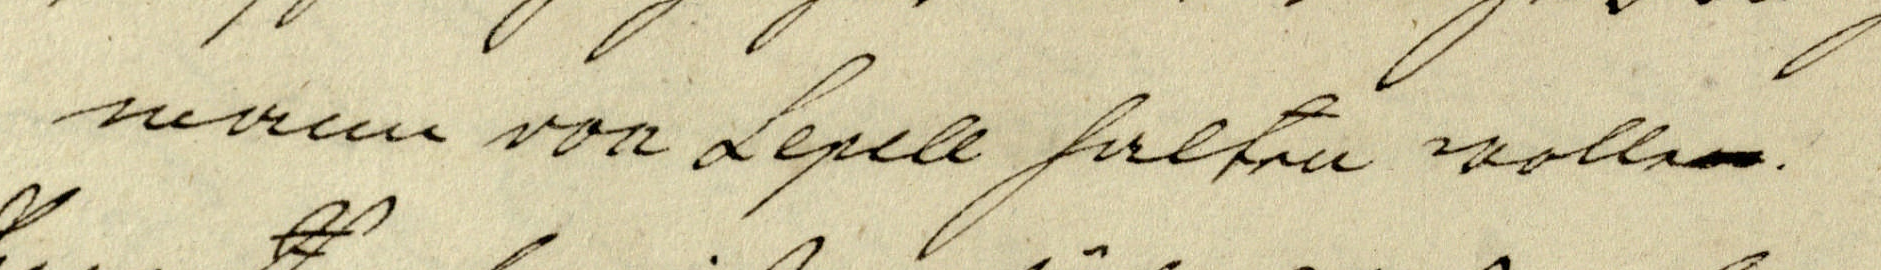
mann von Lepell halten wolle.
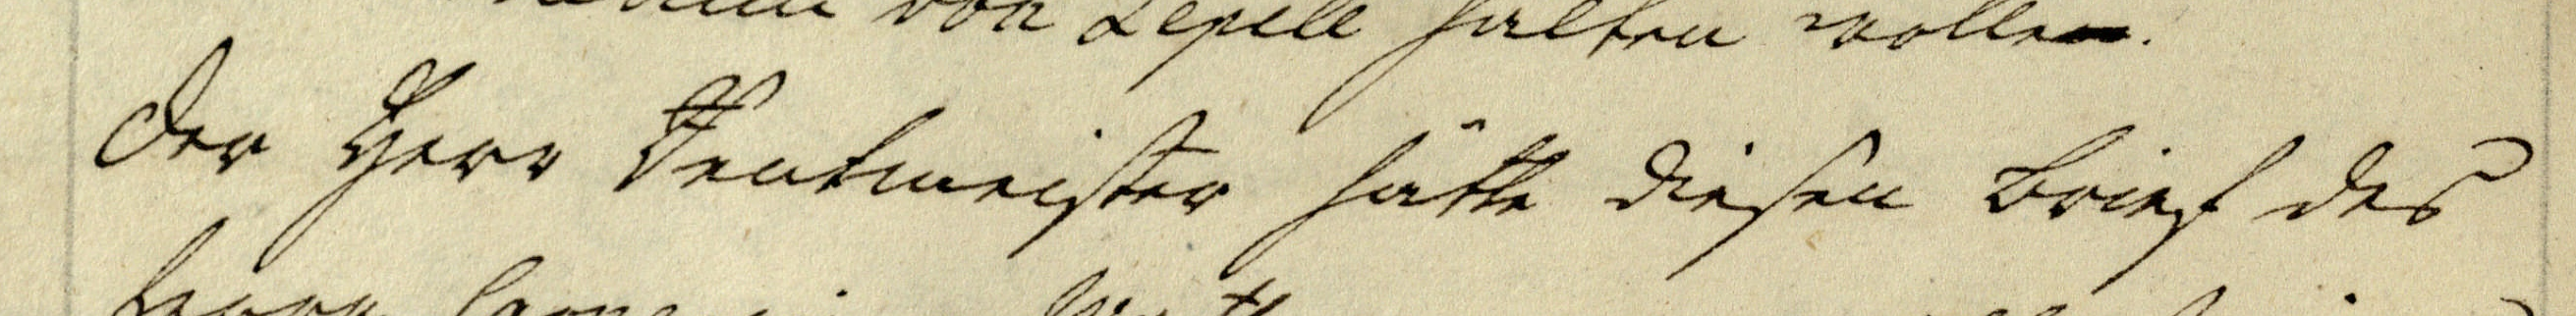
Der Herr Rentmeister hätte diesen Brief des
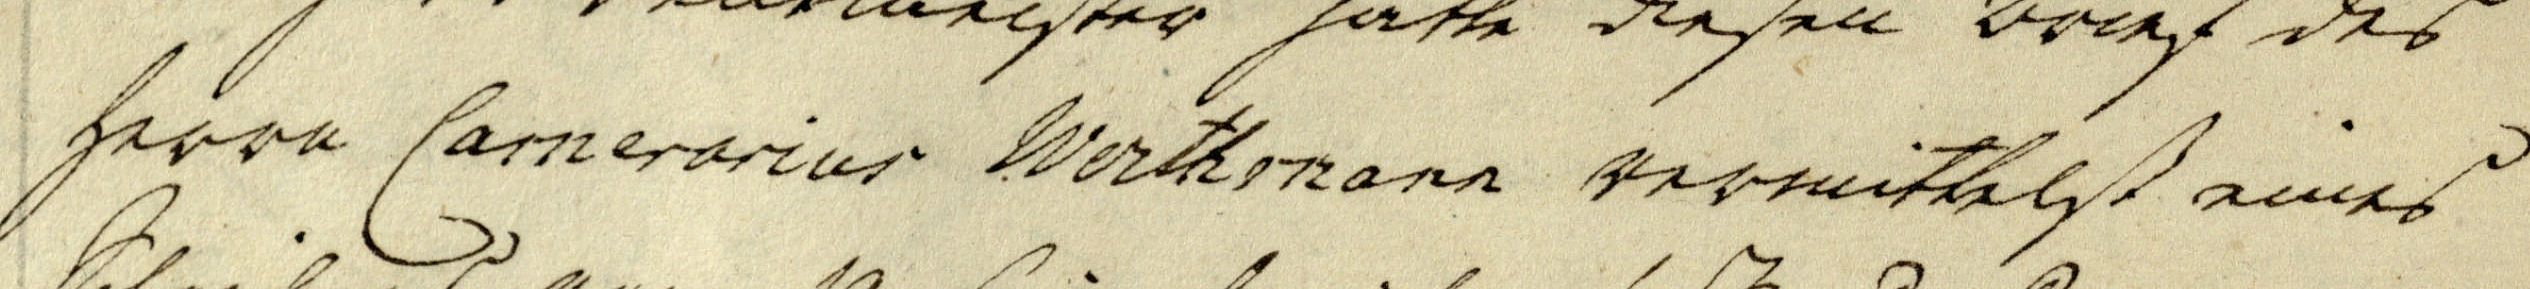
Herrn Camerarius Werthmann vermittelst eines
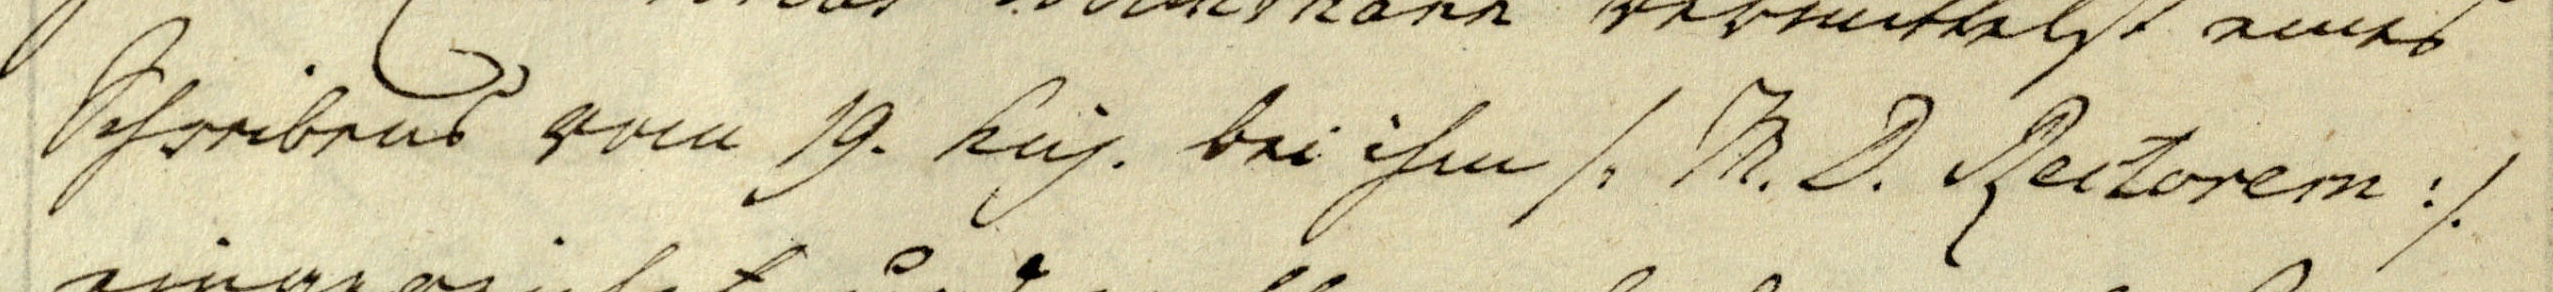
Schreibens vom 19. huj. bei ihm /: M. D. Rectorem :/.
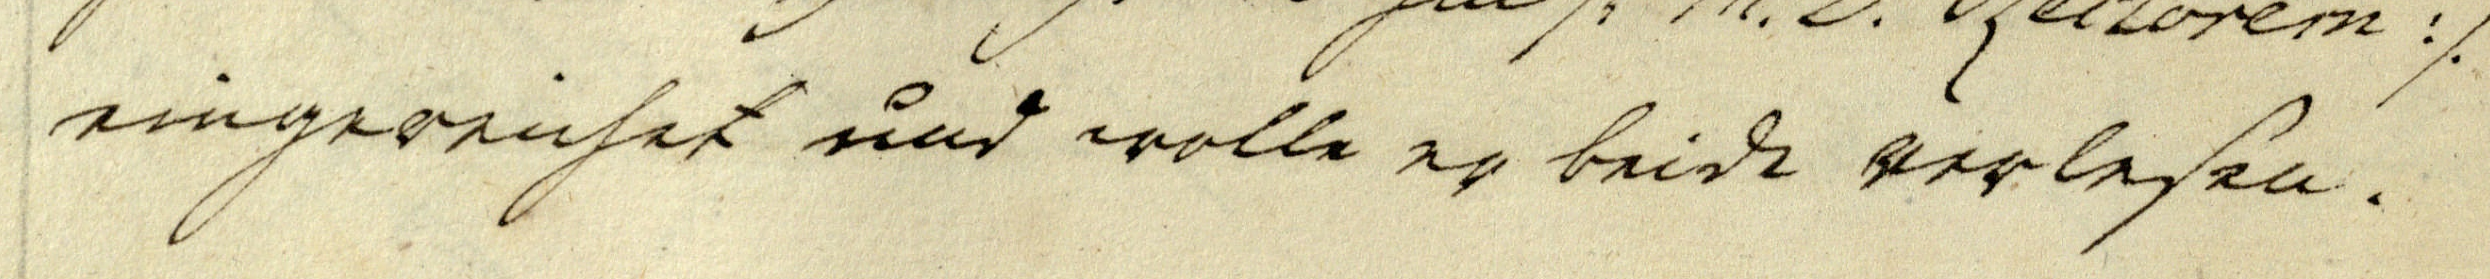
eingereichet und wolle er beide verlesen.
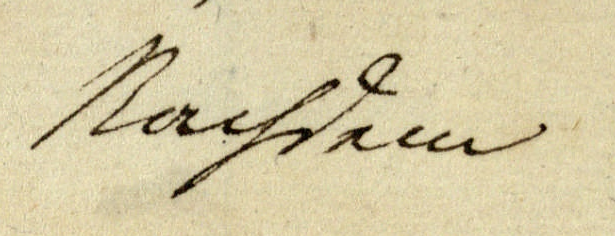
Nachdem
